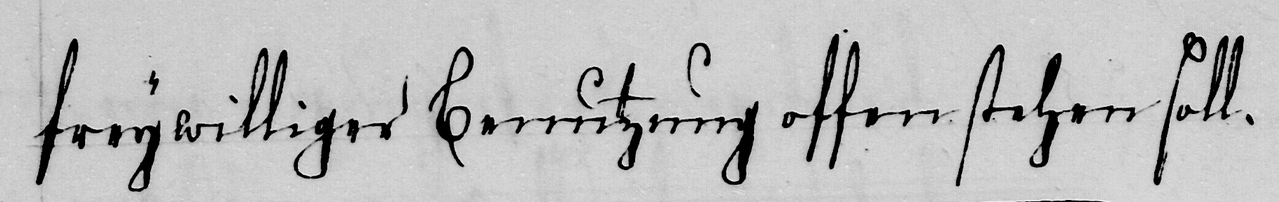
freywilliger Benutzung offen stehen soll.
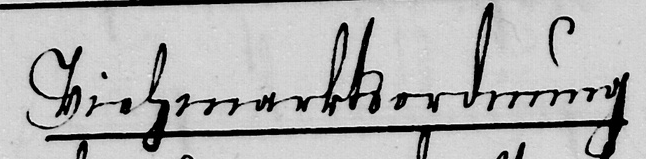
Viehmarktsordnung
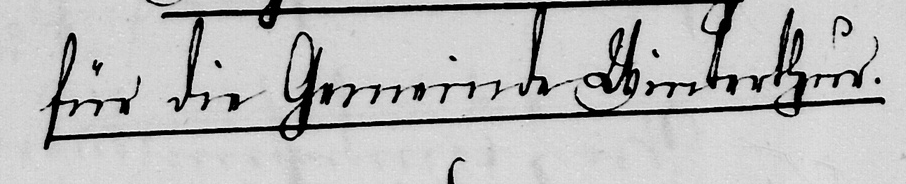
für die Gemeinde Winterthur.
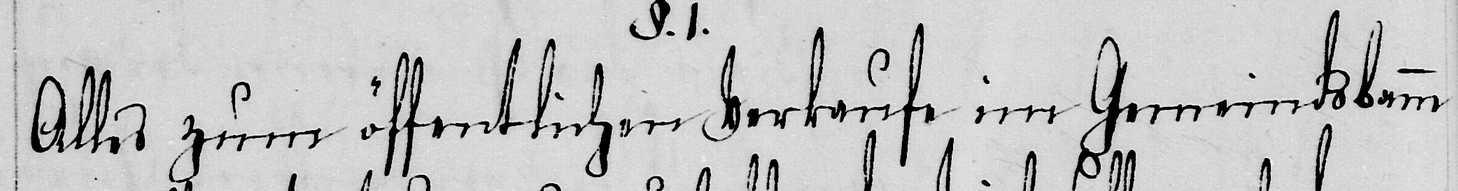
Alles zum öffentlichen Verkaufe im Gemeindsbann
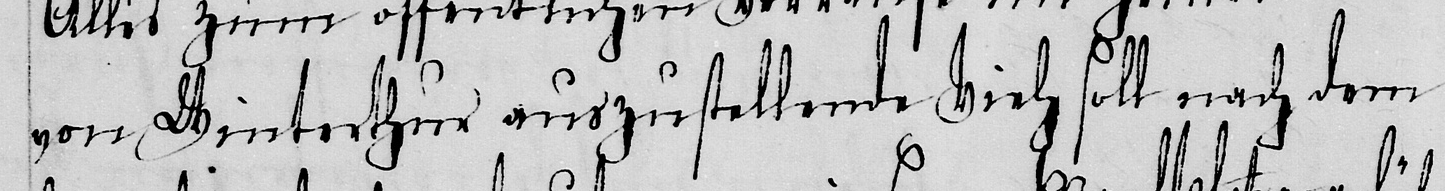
von Winterthur auszustellende Vieh soll nach dem
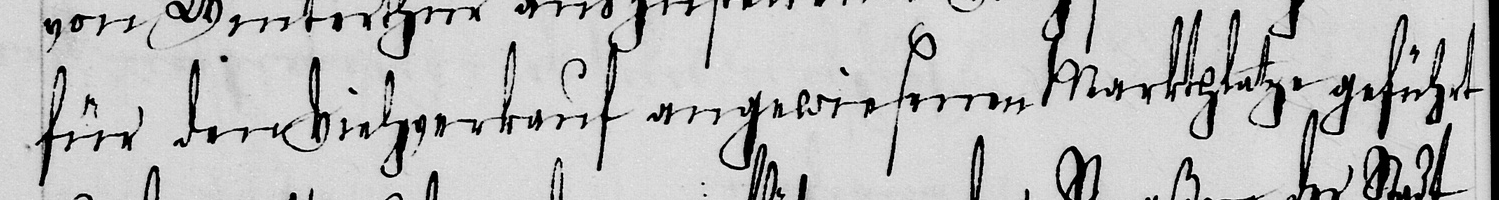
für den Viehverkauf angewiesenen Marktplatze geführt
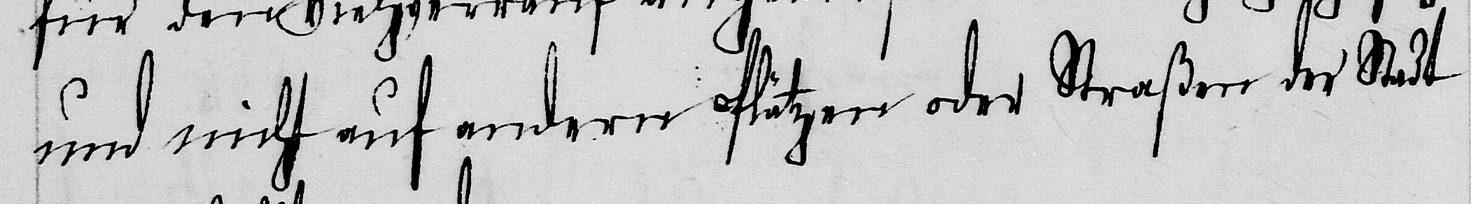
und nicht auf andern Plätzen oder Straßen der Stadt
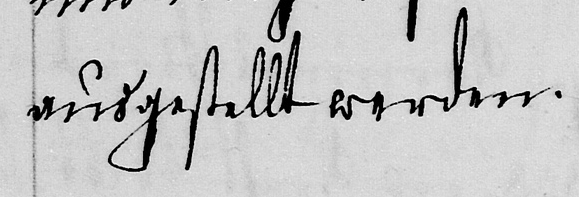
ausgestellt werden.
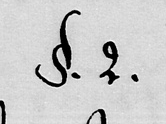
§. 2.
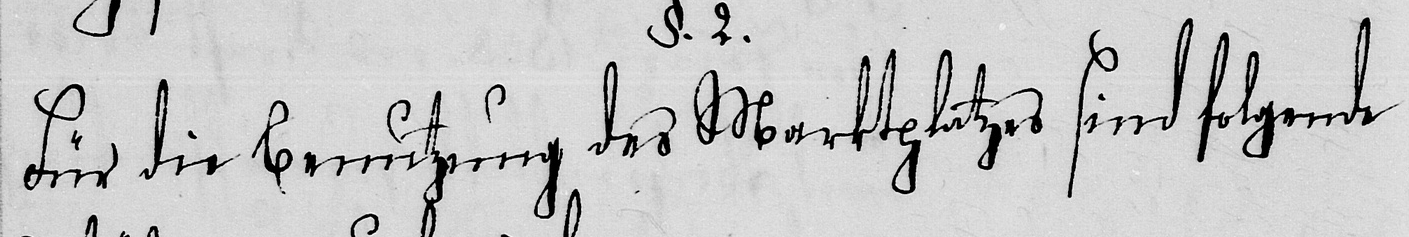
Für die Benutzung des Marktplatzes sind folgende
